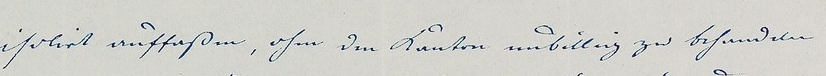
isolirt auffaßen, ohne den Kanton unbillig zu behandeln
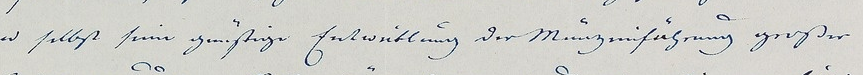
u selbst seine günstige Entwicklung der Münzeinführung großer
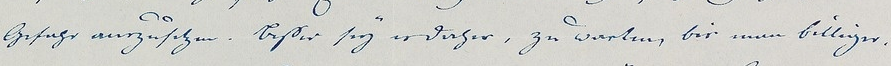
Gefahr auszusetzen. Besser sey es daher, zu warten, bis man billiger-
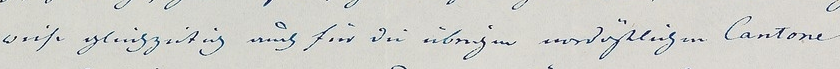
weise gleichzeitig auch für die übrigen nordöstlichen Cantone
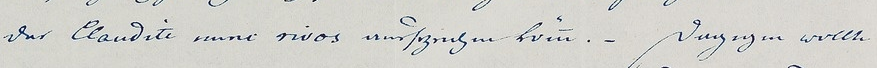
das Claudite nunc rivos aussprechen könne. – Dagegen wollte
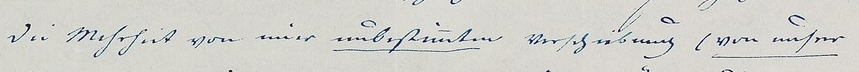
die Mehrheit von einer unbestimmten Verschiebung (von unsrer
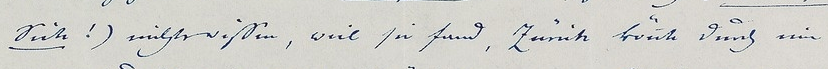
Seite!) nichts wissen, weil sie fand, Zürich könnte durch eine
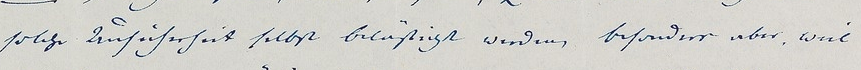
solche Unsicherheit selbst belästigt werden, besonders aber, weil
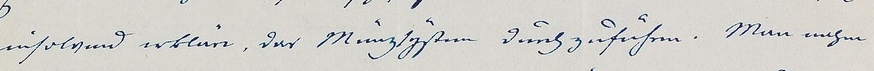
insolvend erkläre, das Münzsystem durchzuführen. Man nahm
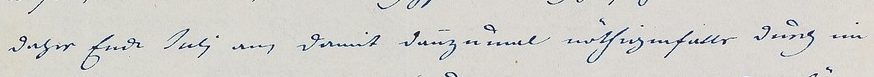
daher Ende Juli an, damit dannzumal nöthigenfalls durch ein
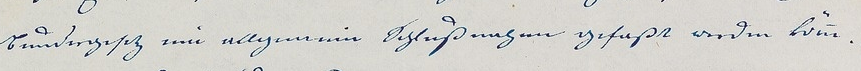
Bundesgesetz eine allgemeine Schlußnahme gefaßt werden könne.
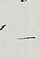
–
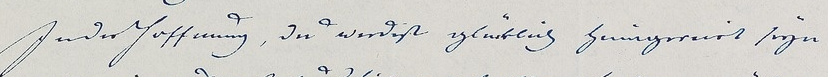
In der Hoffnung, du werdest glücklich heimgereist seyn
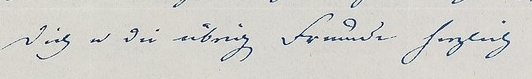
Dich u die übrigen Freunde herzlich
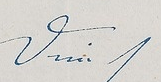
Dein
